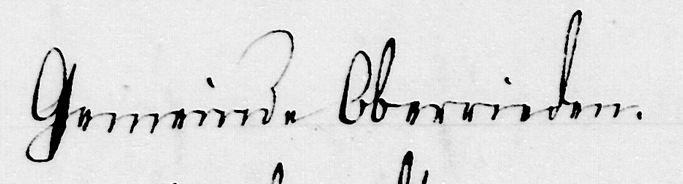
Gemeinde Oberrieden.
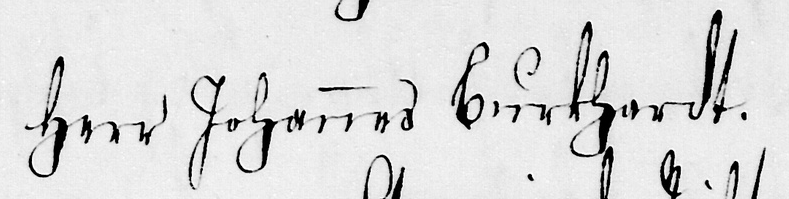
Herr Johannes Burkhardt.
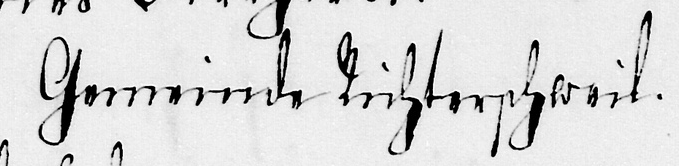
Gemeinde Richterschweil.
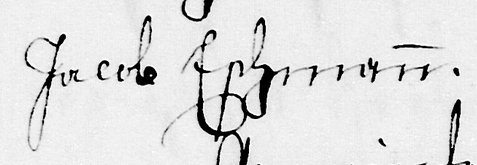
acob Eschmann.
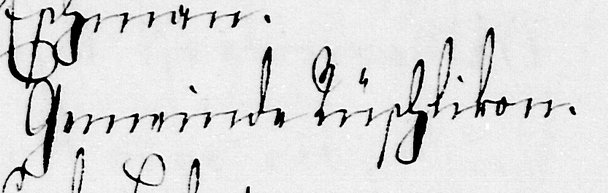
Gemeinde Rüschlikon.
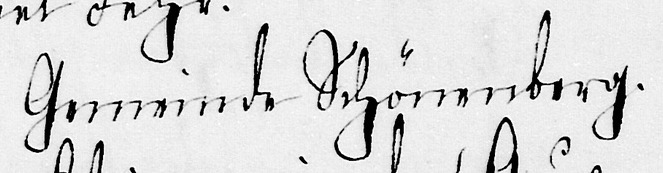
Gemeinde Schönenberg.
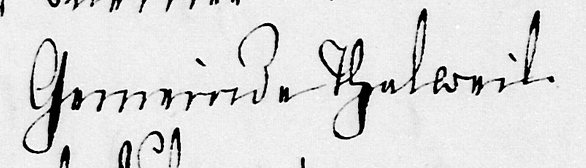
Gemeinde Thalweil.
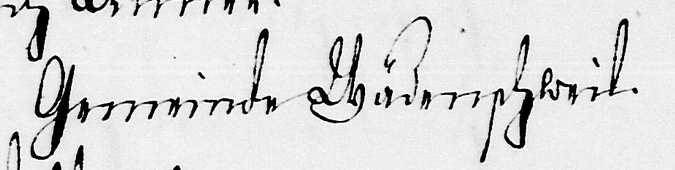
Gemeinde Wädenschweil.
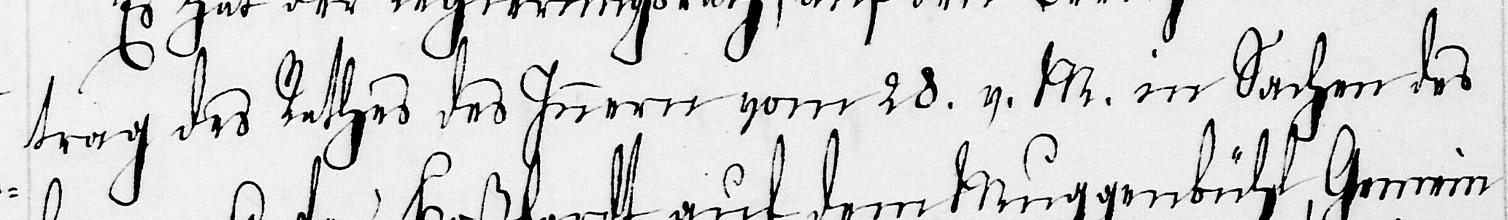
trag des Rathes des Innern vom 28. v. M. in Sachen des
